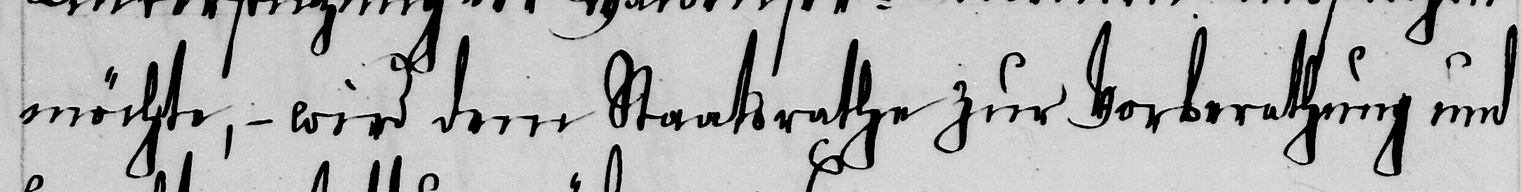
möchte, – wird dem Staatsrathe zur Vorberathung und
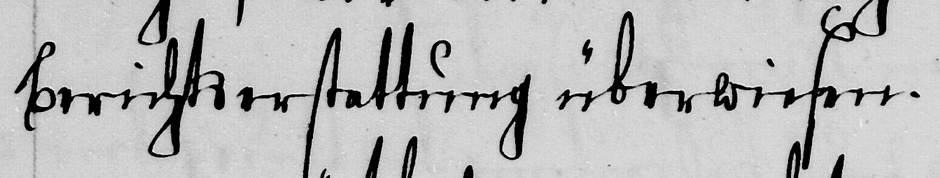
Berichtserstattung überwiesen.
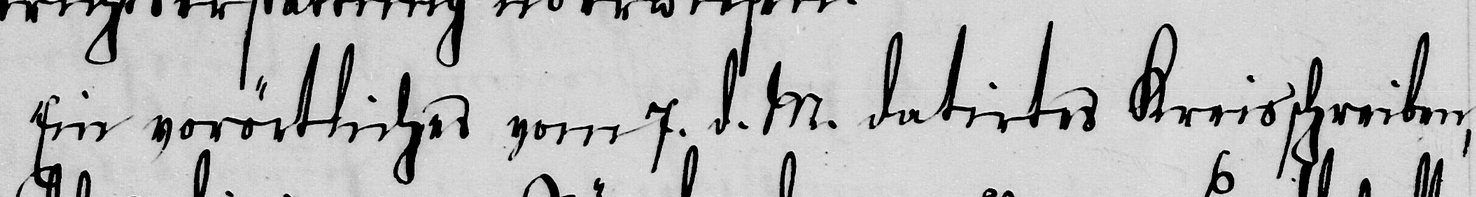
Ein vorörtliches vom 7. d. M. datirtes Kreisschreiben,
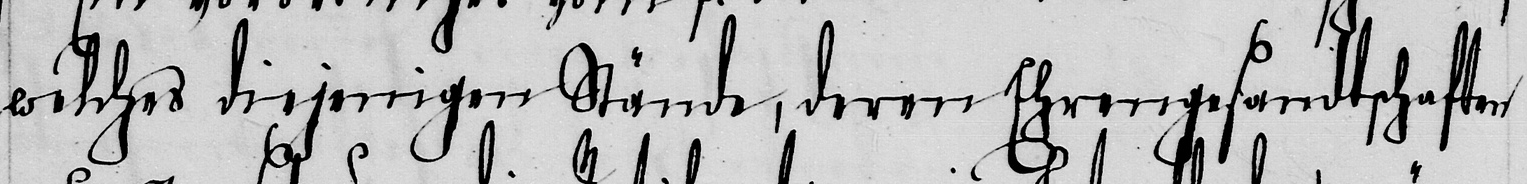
welches diejenigen Stände, deren Ehrengesandtschaften
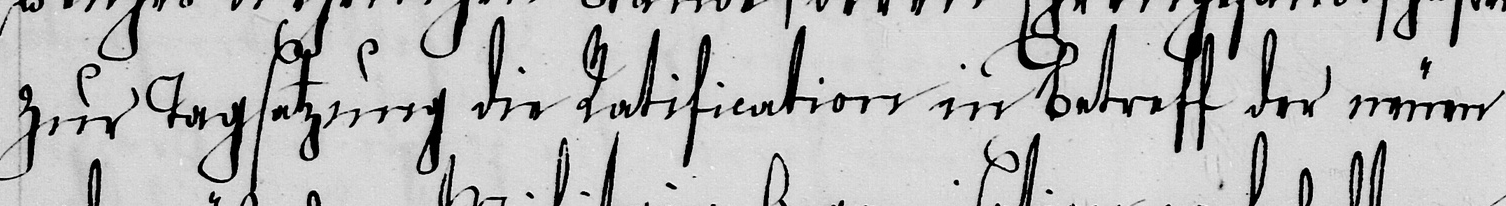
zur Tagsatzung die Ratification in Betreff der neuen
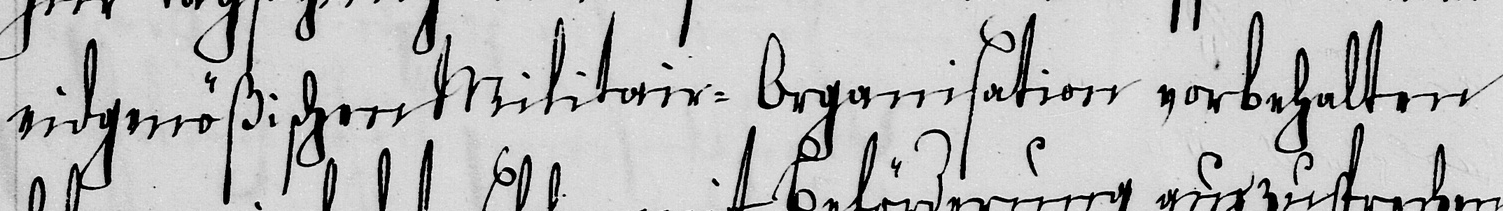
eidgenößischen Militair-Organisation vorbehalten
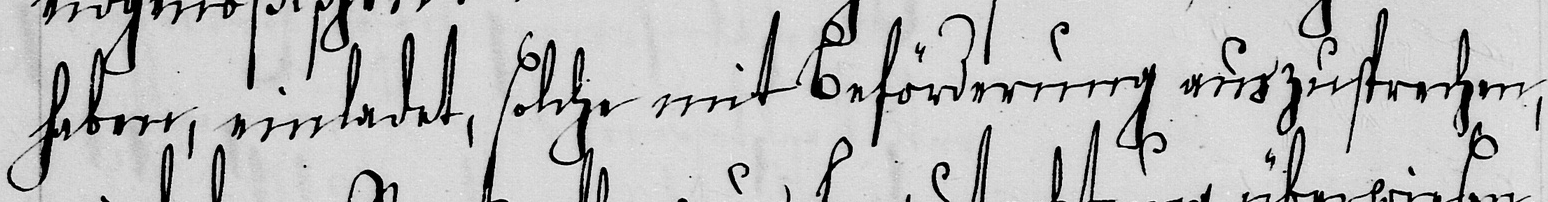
haben, einladet, solche mit Beförderung auszusprechen,
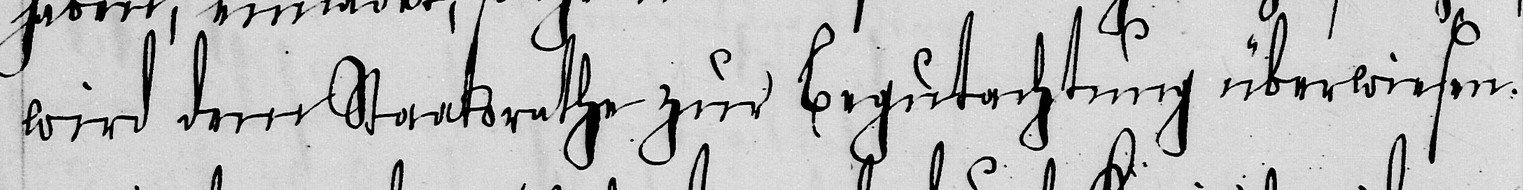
wird dem Staatsrathe zur Begutachtung überwiesen.
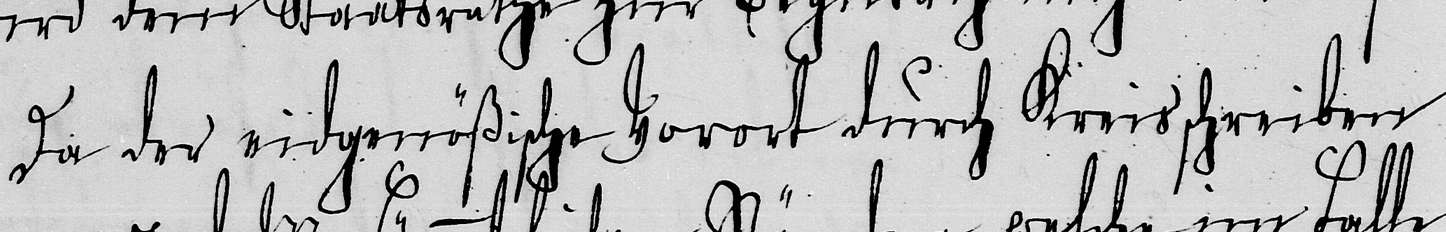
Da der eidgenößische Vorort durch Kreisschreiben
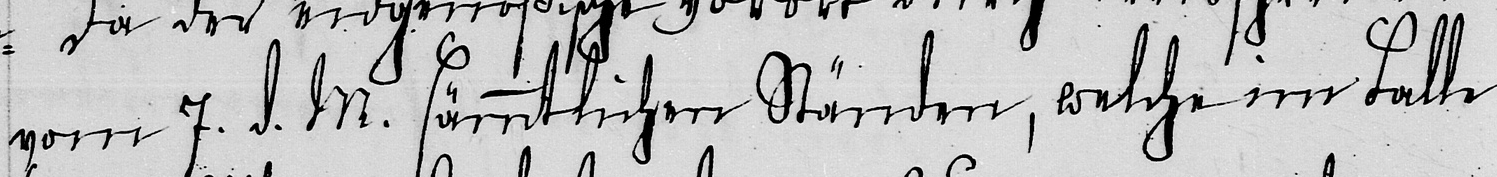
vom 7. d. M. sämmtlichen Ständen, welche im Falle
